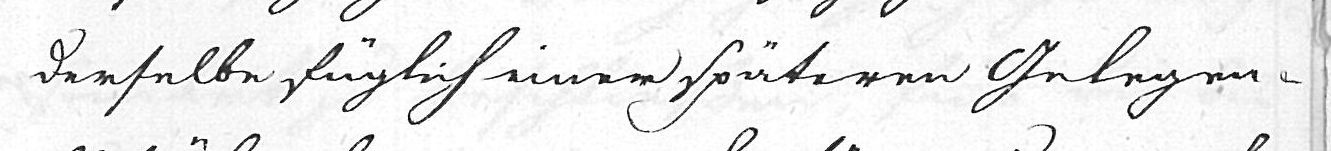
derselbe füglich einer späteren Gelegen-
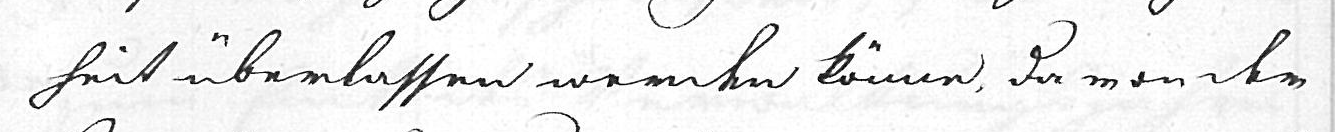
heit überlassen werden könne, da von der
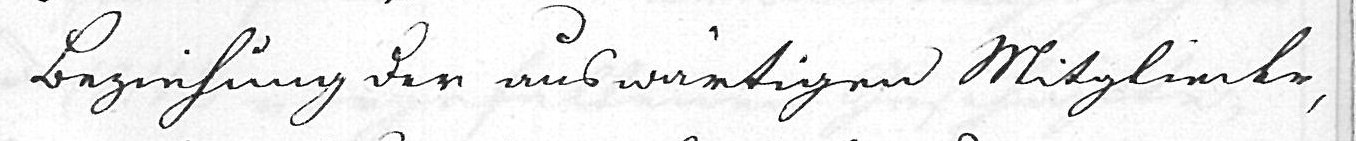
Beziehung der auswärtigen Mitglieder,
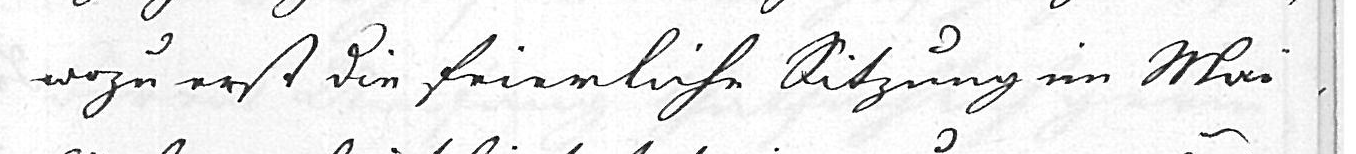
wozu erst die Feierliche Sitzung im Mai
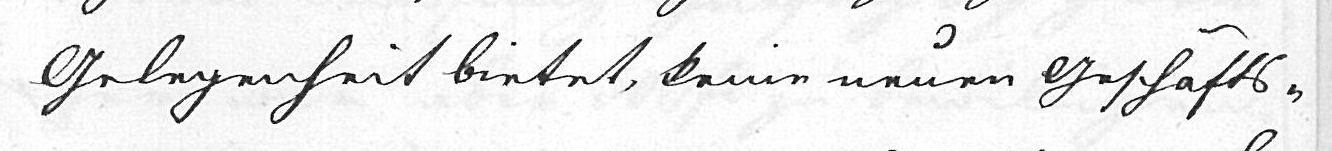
Gelegenheit bietet, keine neuen Geschäfts-
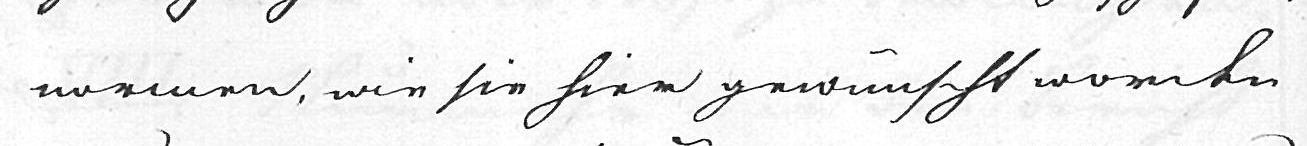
normen, wie sie hier gewünscht worden
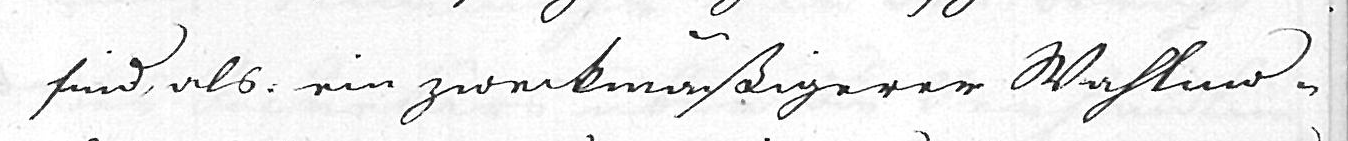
sind, als ein zweckmäßigerer Wahlmo-
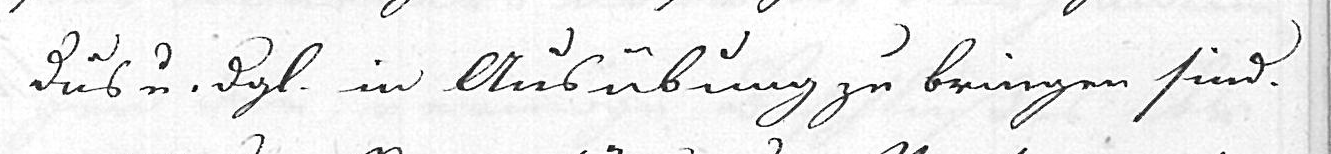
dus u. dgl. in Ausübung zu bringen sind.
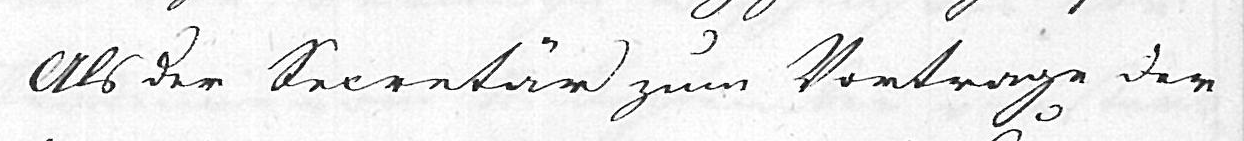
Als der Secretär zum Vortrage der
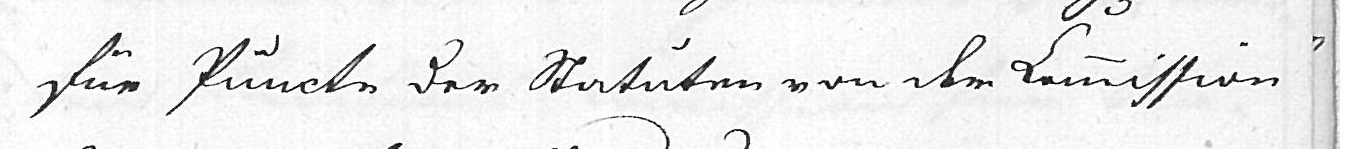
für Puncte der Statuten von der Commission
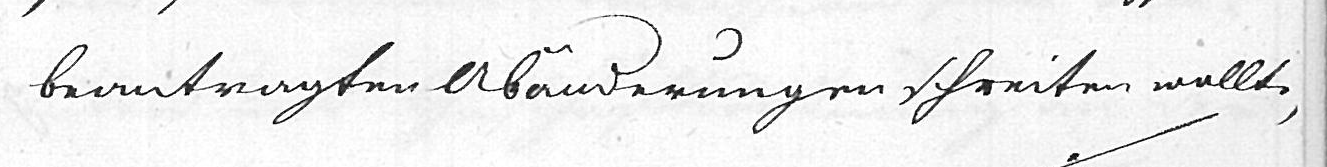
beantragten Abänderungen schreiten wollte,
